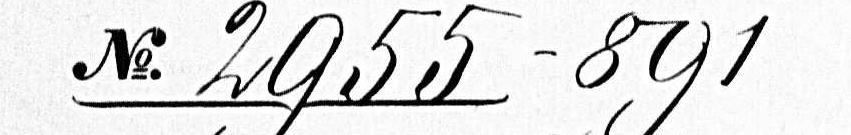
No. 2955 - 1891
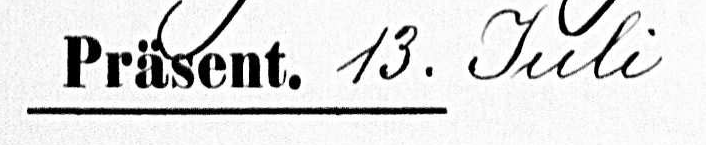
Präsent. 13. Juli
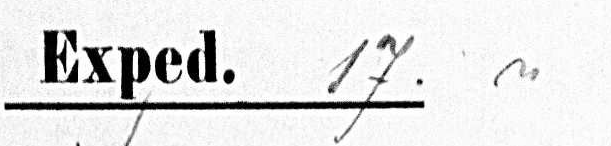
Exped. 17. Juli
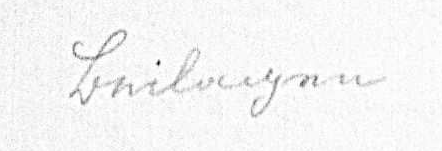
Beilagen
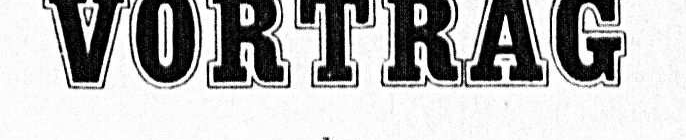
VORTRAG
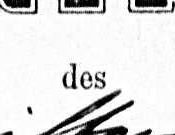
des
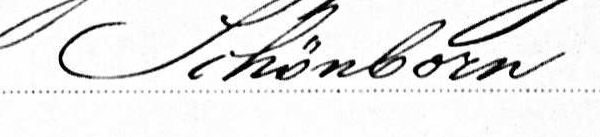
Schönborn
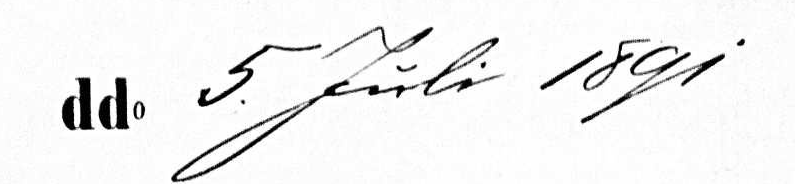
ddo 5. Juli 1891
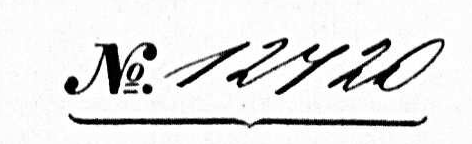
No. 12420
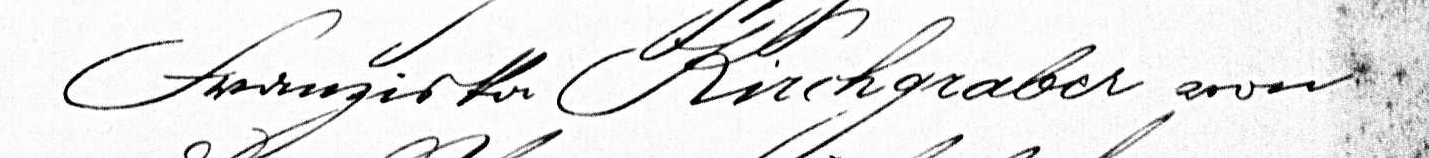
Franziska Kirchgraber von
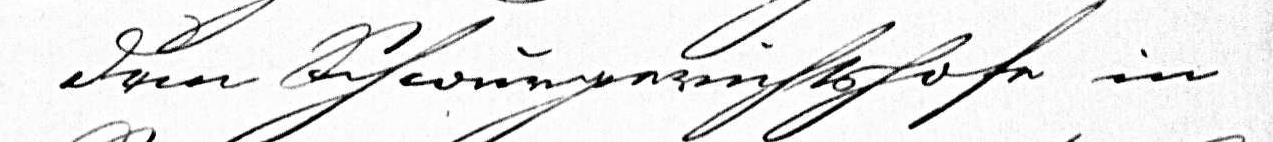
dem Schwurgerichtshofes in
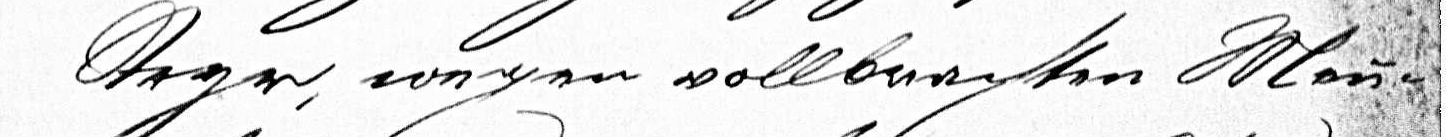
Steyr, wegen vollbrachten Meu¬
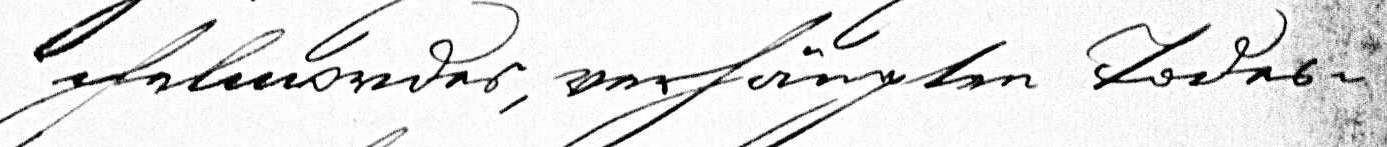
chelmordes, verhängten Todes¬
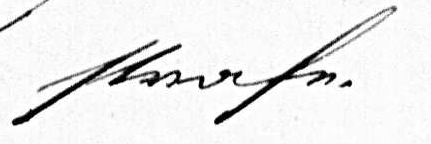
strafe.
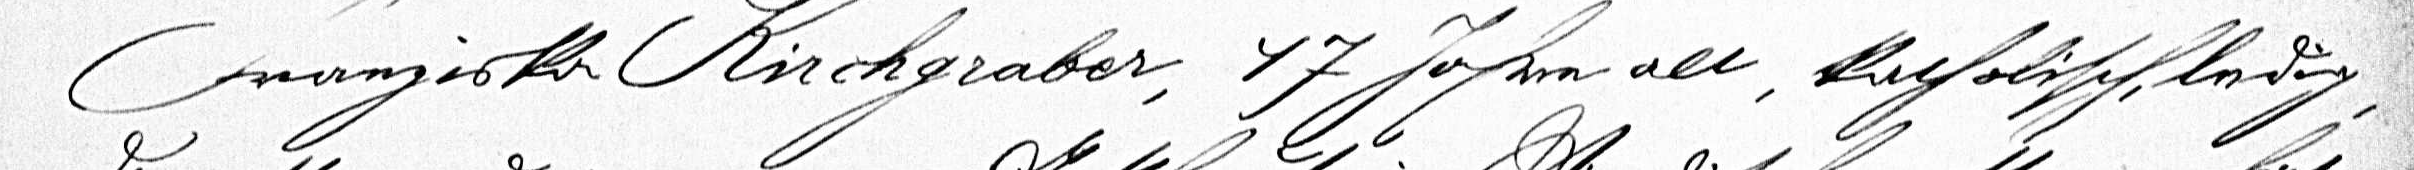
Franziska Kirchgraber, 47 Jahre alt, katholisch, ledig,
